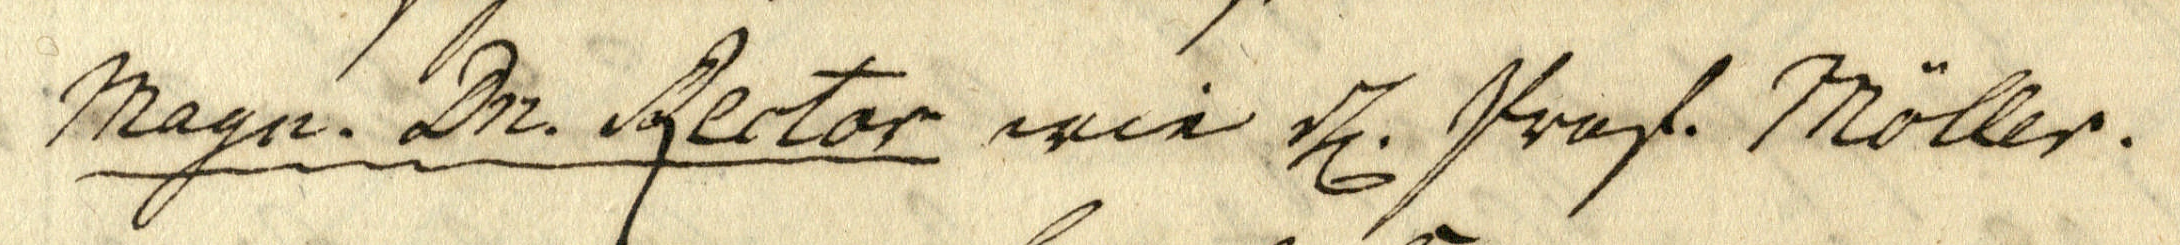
Magn. Dn. Rector wie dh. Prof. Möller.
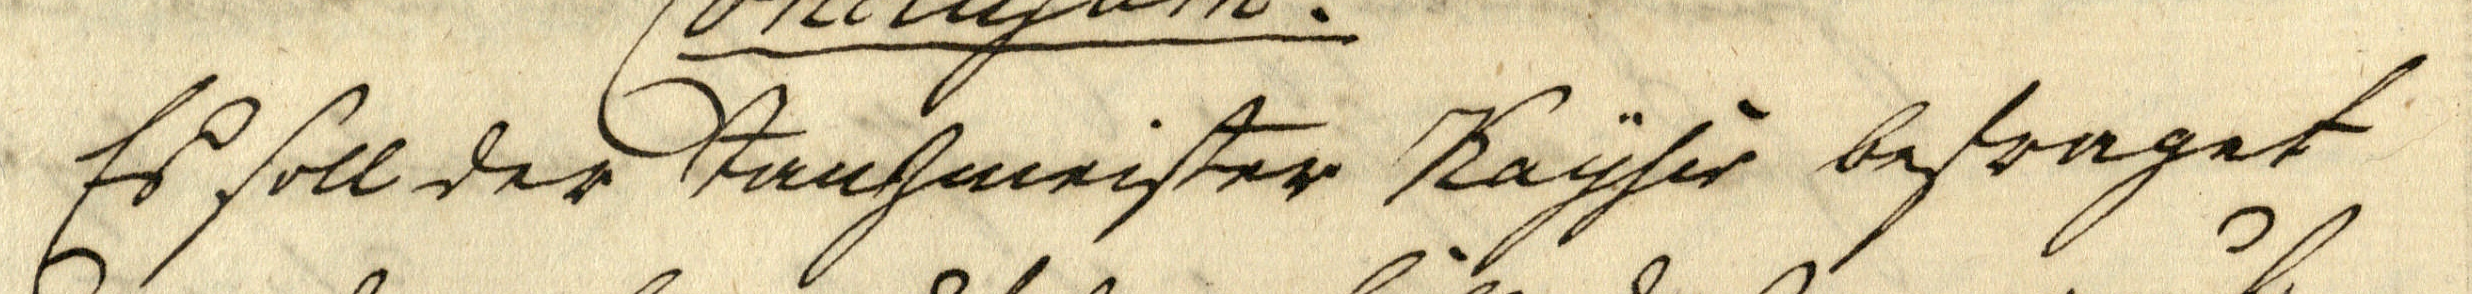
Es soll der Tanzmeister Kayser befraget
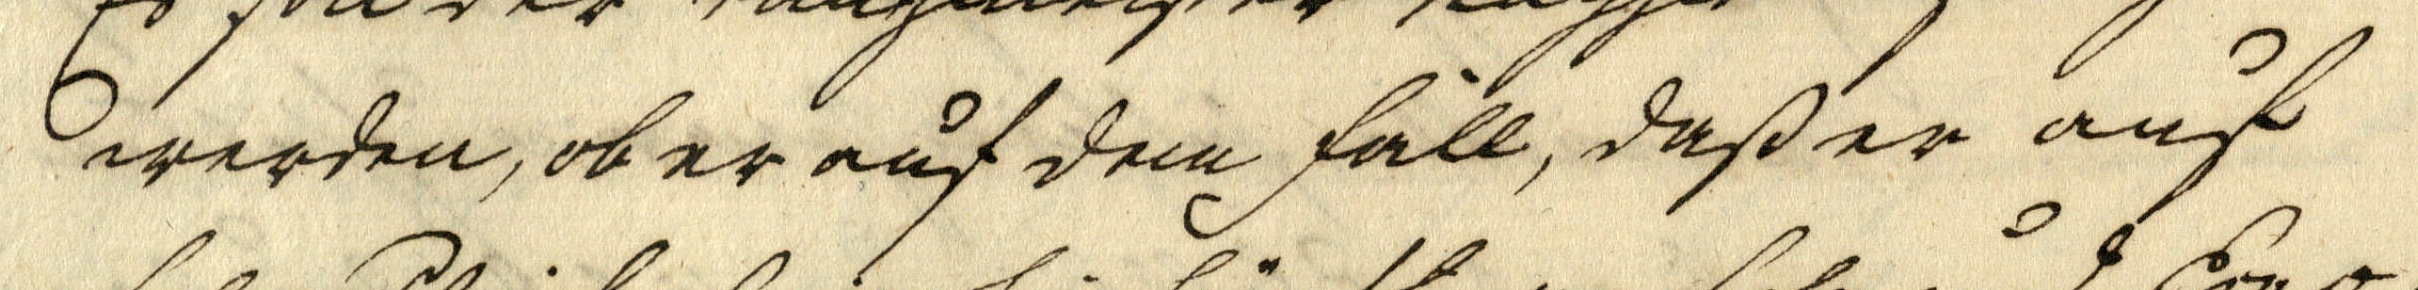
werden, ob er auf dem Fall, daß er auf
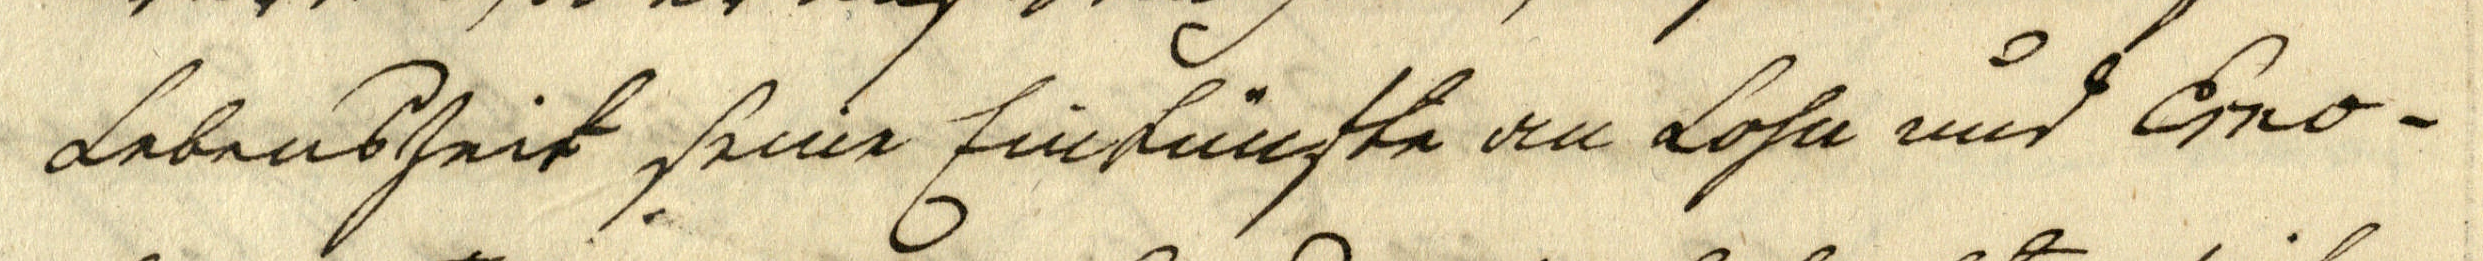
Lebenszeit seine Einkünfte an Lohn und Emo-
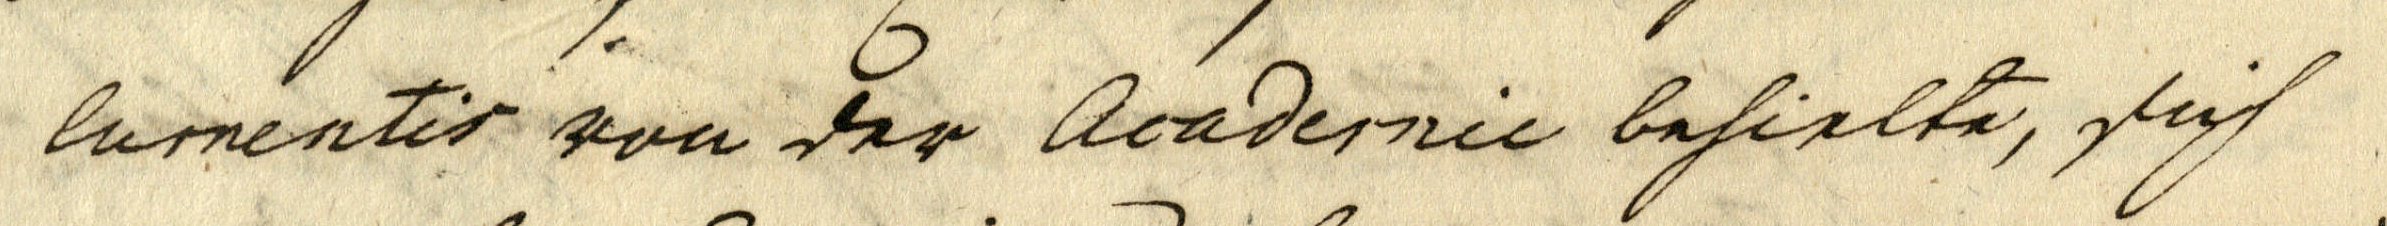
lumentis von der Academie behielte, sich
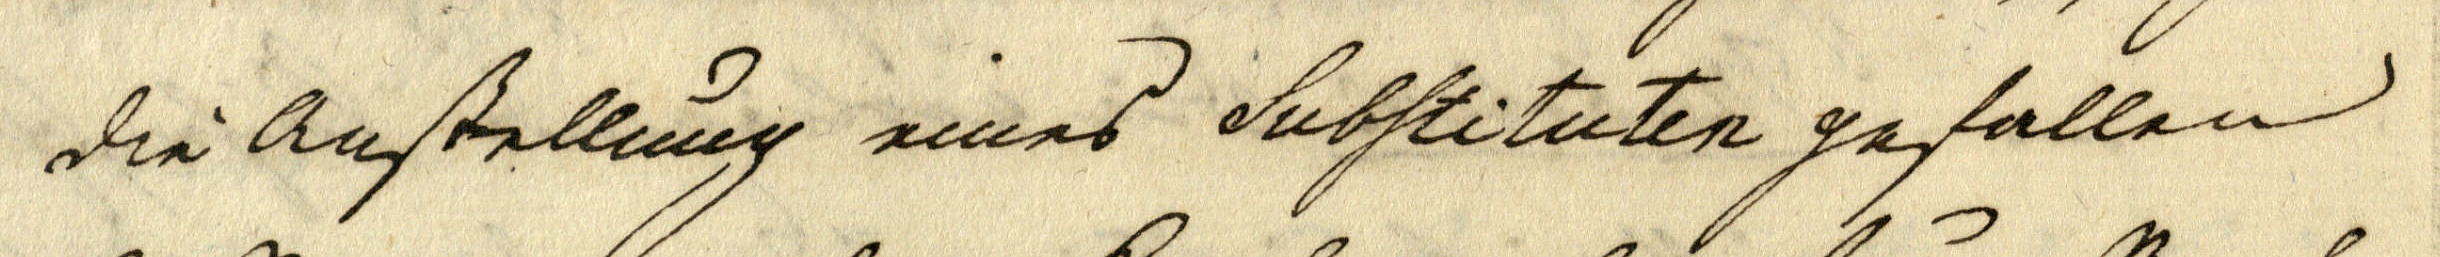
die Anstellung eines Substituten gefallen
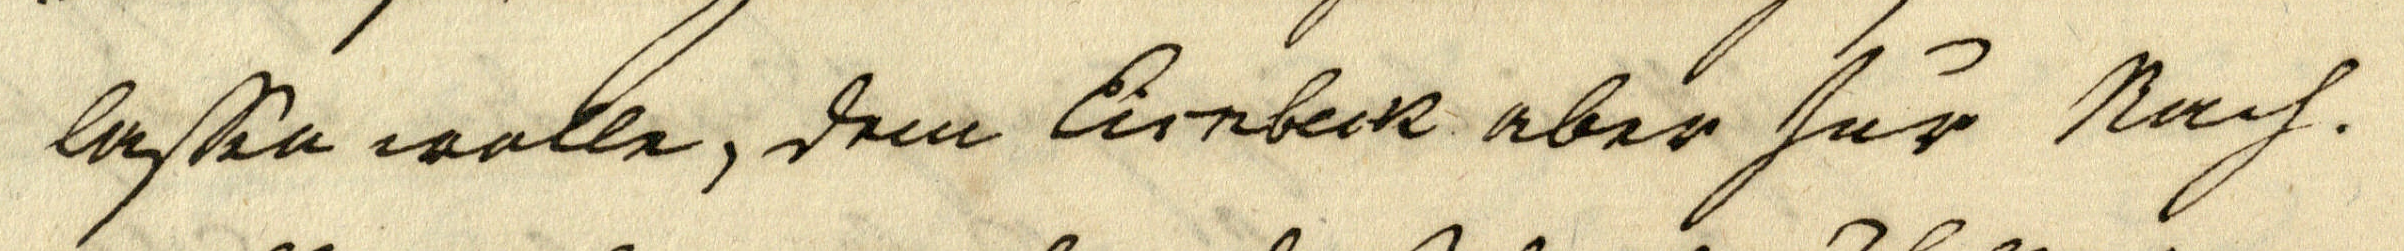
lassen wolle, dem Eimbeck aber zur Nach-
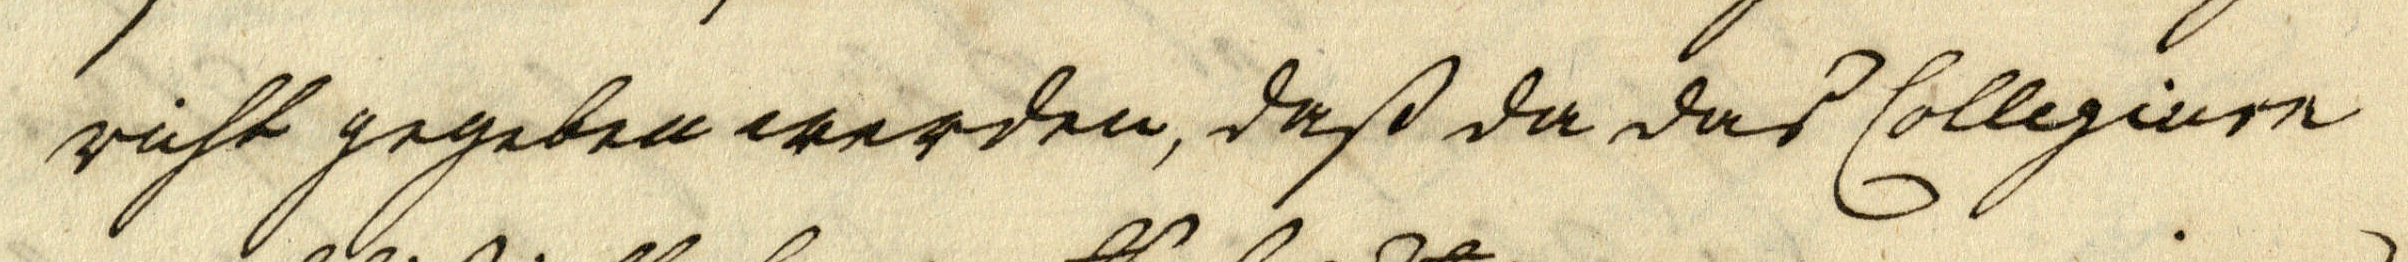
richt gegeben werden, daß da das Collegium
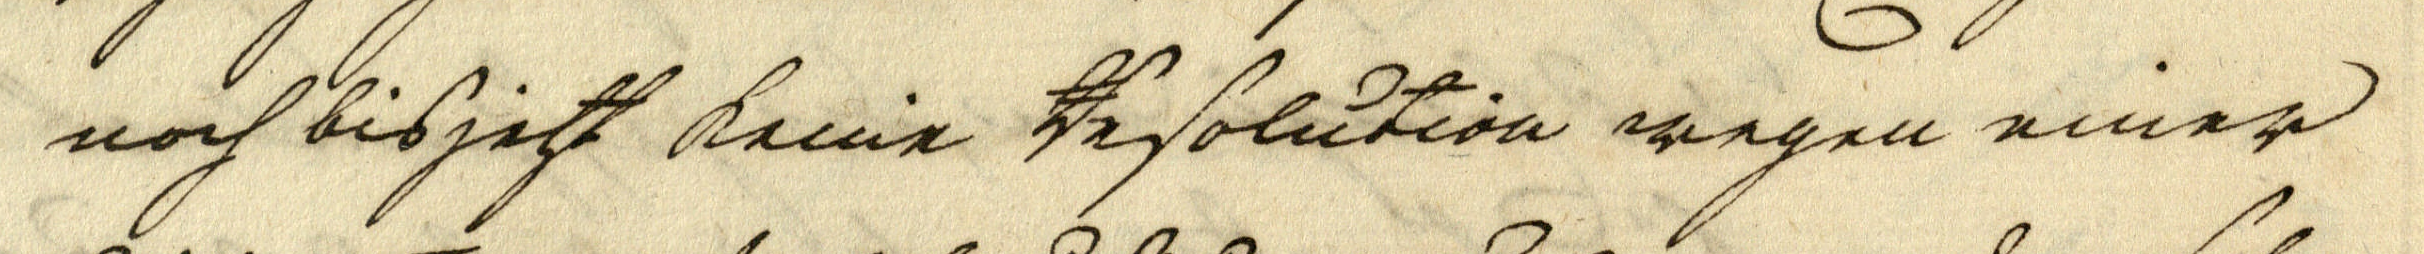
noch bis jetzt keine Resolution wegen einer
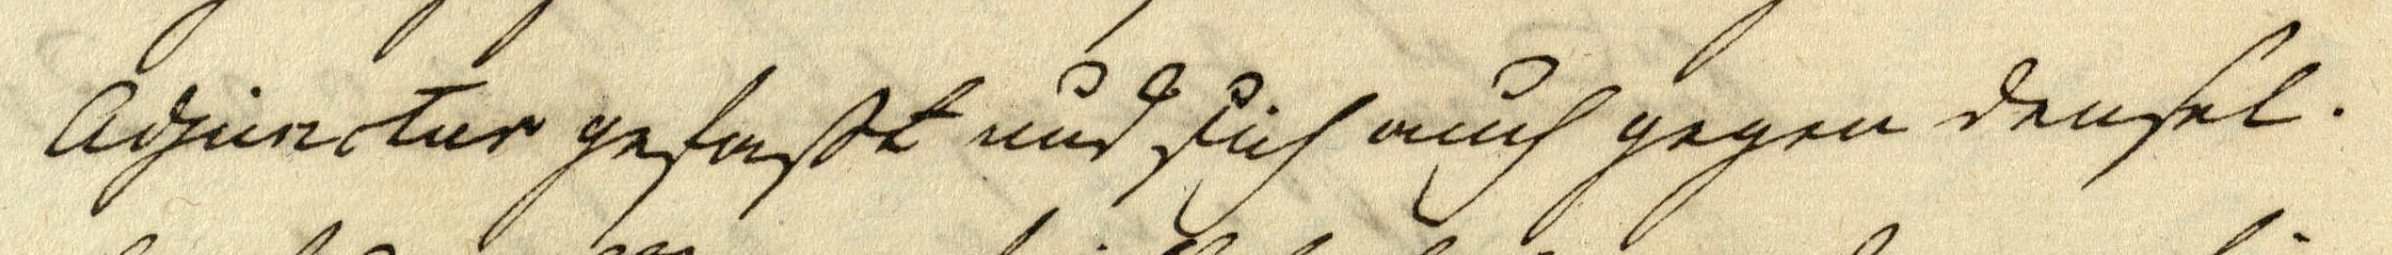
Adjunctur gefasset und sich auch gegen densel-
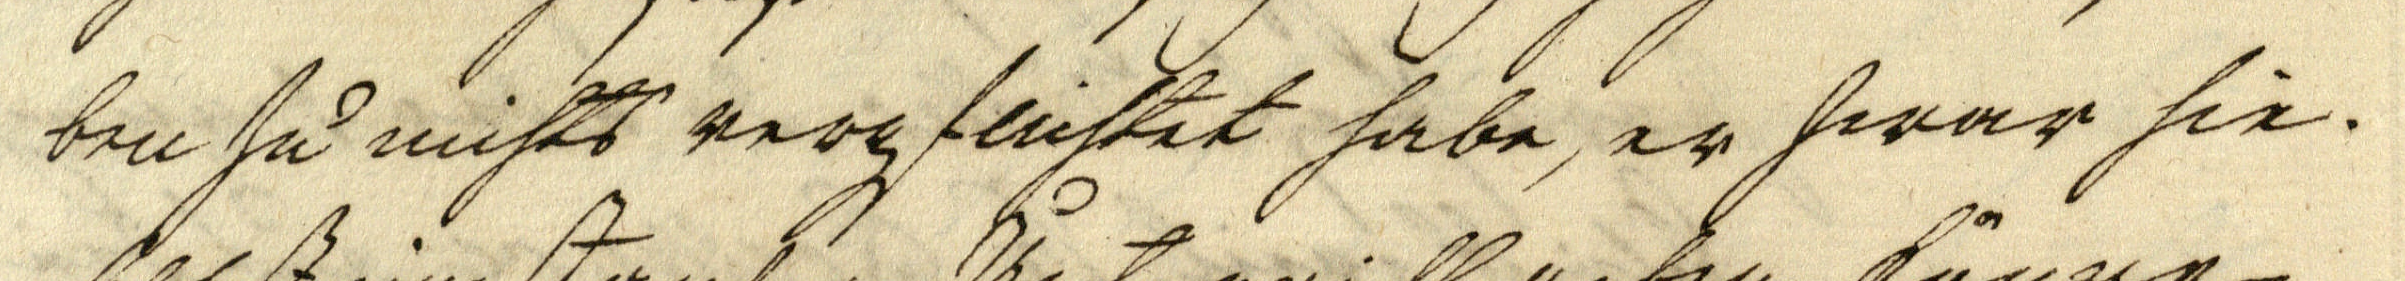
ben zu nichts verpflichtet habe, er zwar hie-
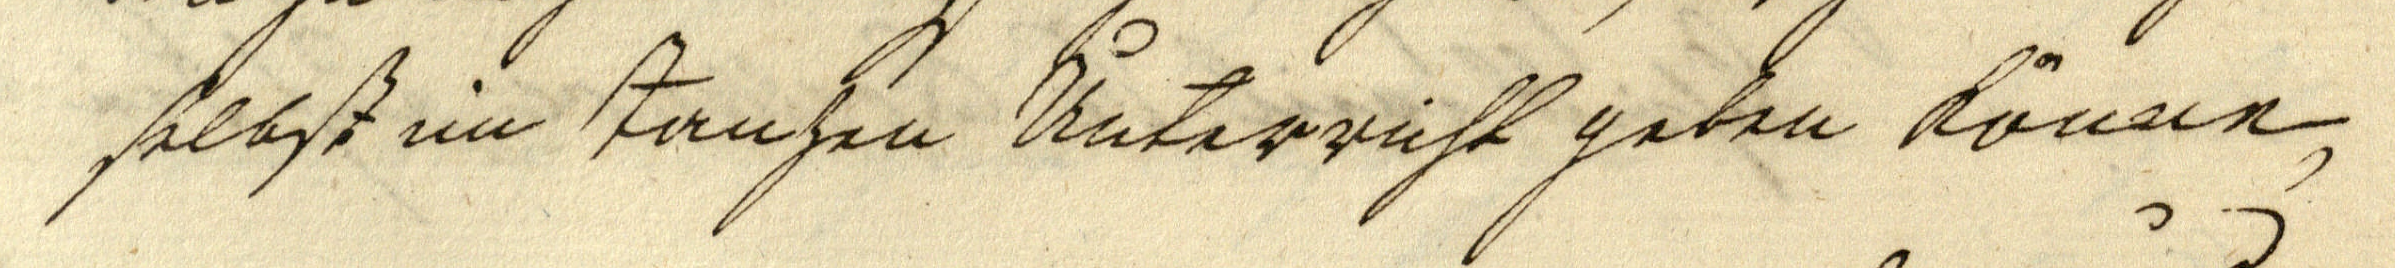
selbst im Tanzen Unterricht geben könne,
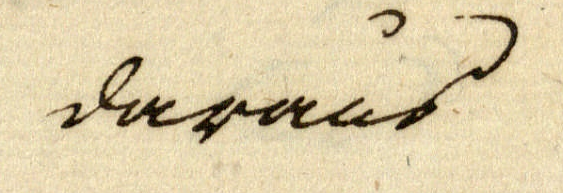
daraus
